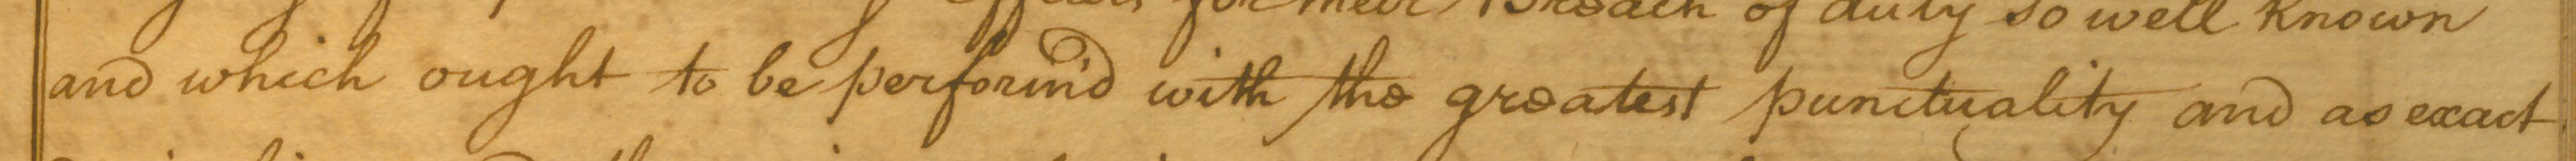and which ought to be perform'd with the greatest punctuality and as exact
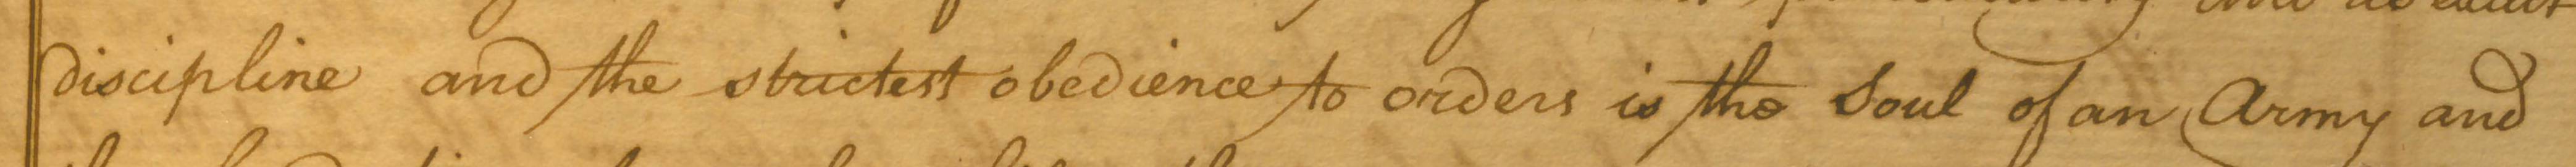discipline and the strictest obedience to orders is the Soul of an Army and
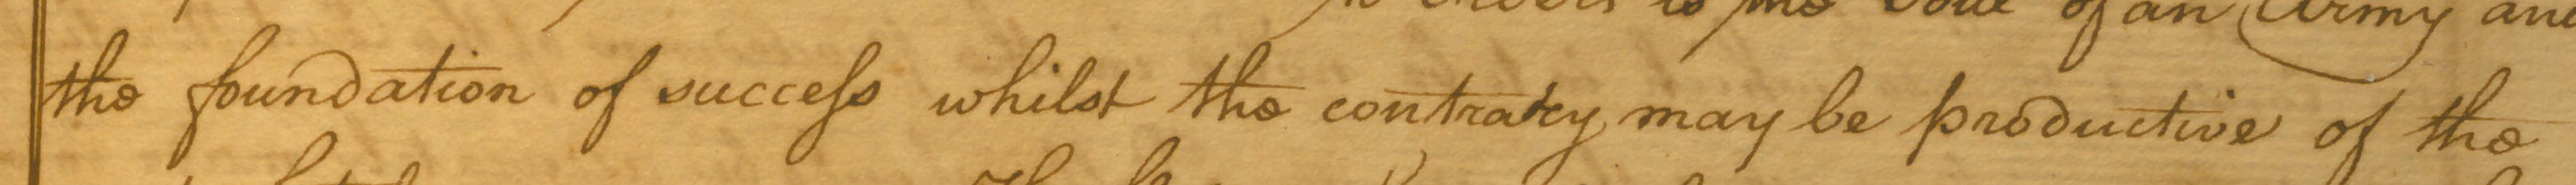the foundation of success whilst the contrary may be productive of the
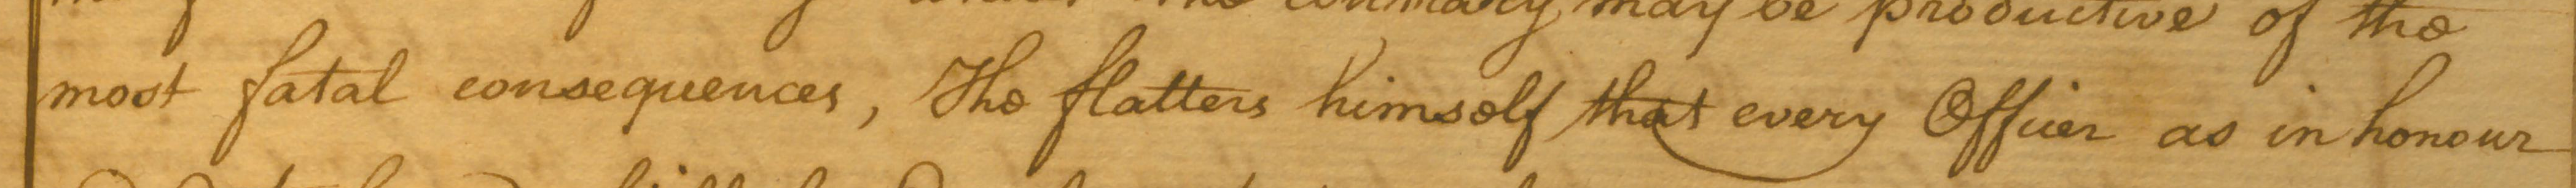most fatal consequences, He flatters himself that every Officer as in honour
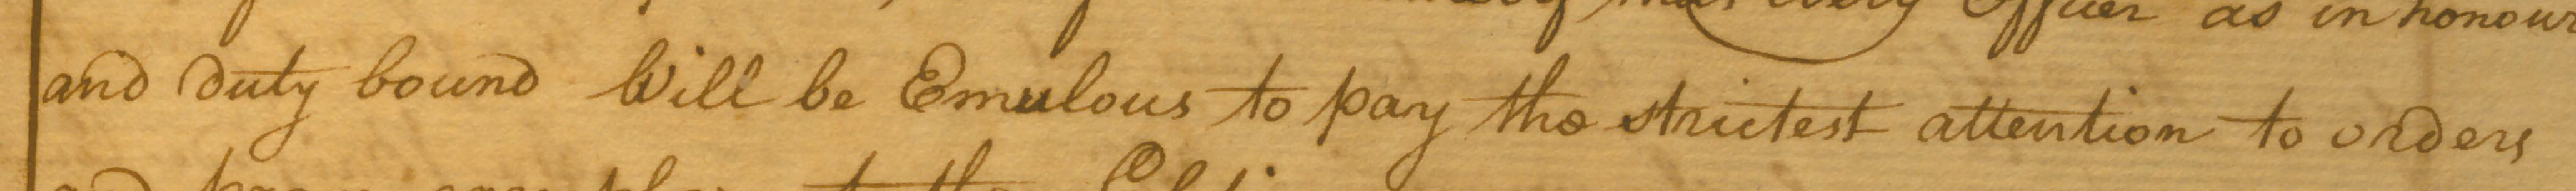and duty bound Will be Emulous to pay the strictest attention to orders
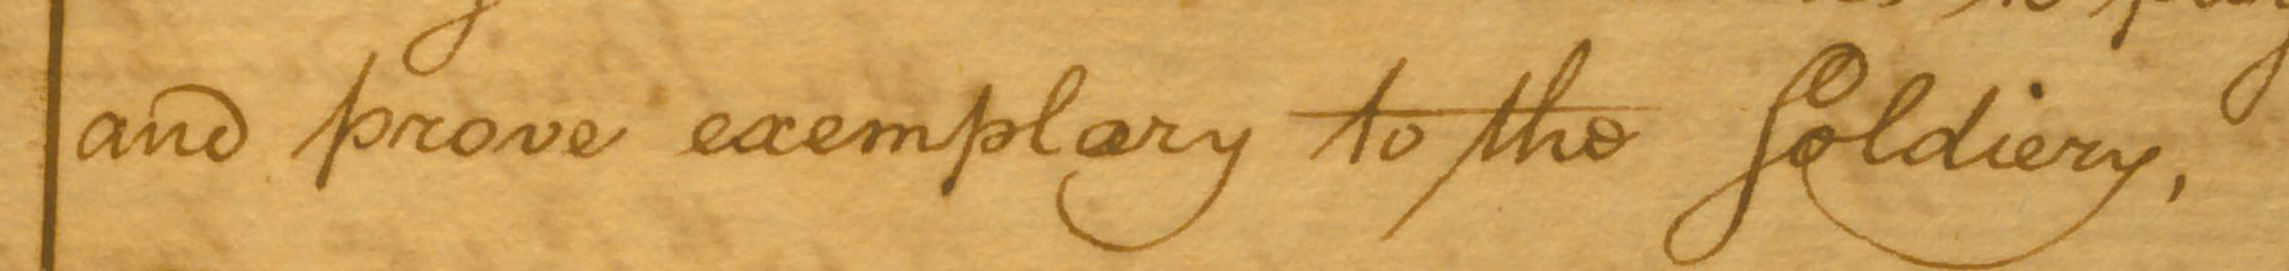and prove exemplary to the Soldiery.
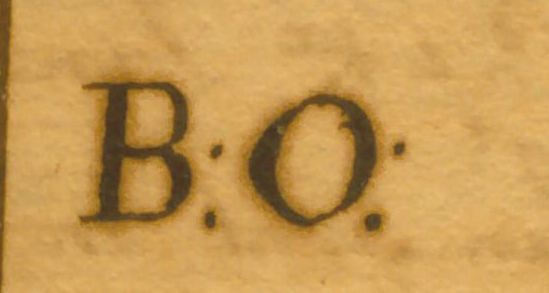B: O:
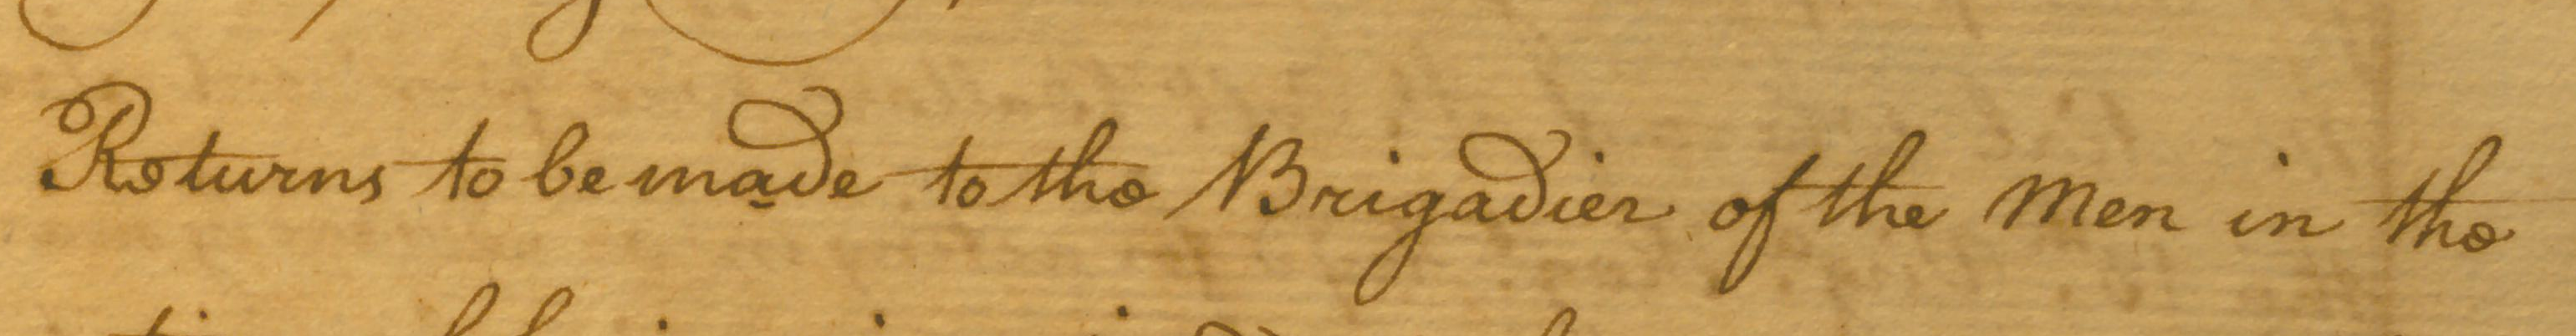Returns to be made to the Brigadier of the men in the
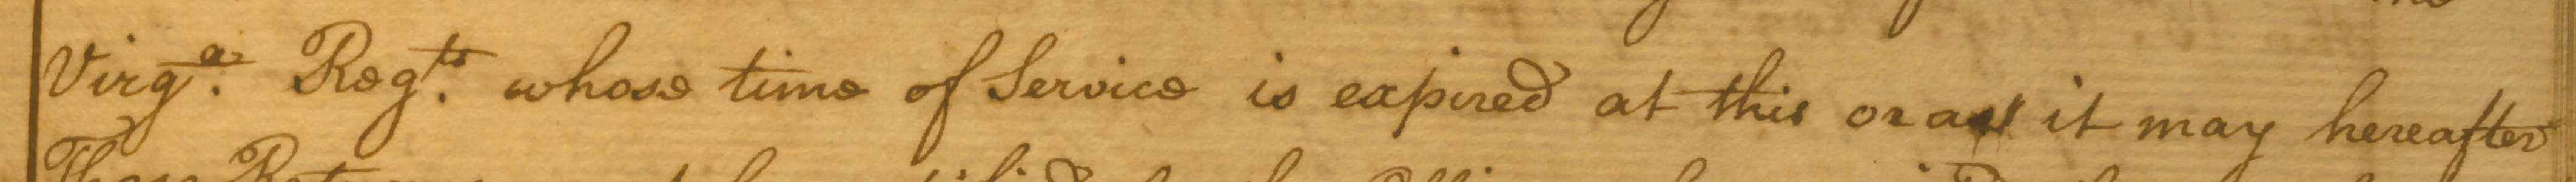Virg^a. Reg^ts. whose time of Service is expired at this or as it may hereafter
